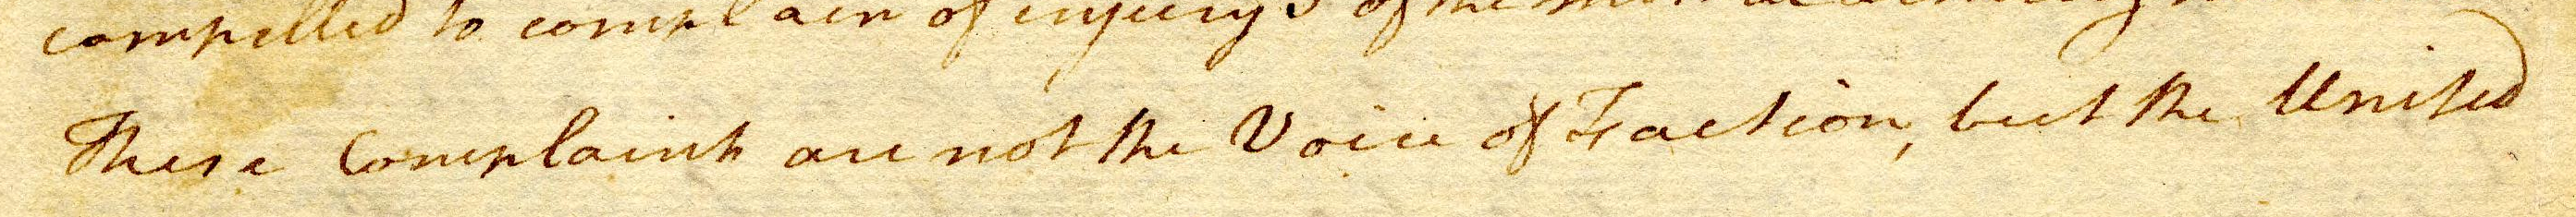These Complaints are not the Voice of Faction, but the United
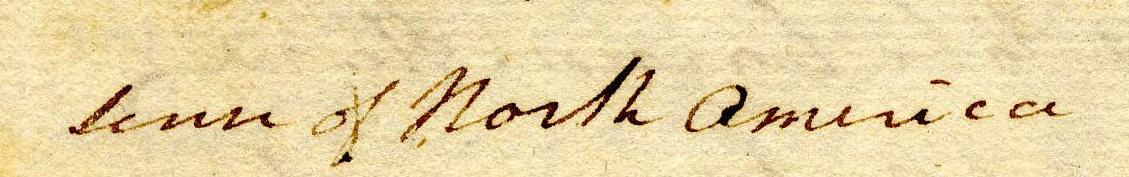sum of North America
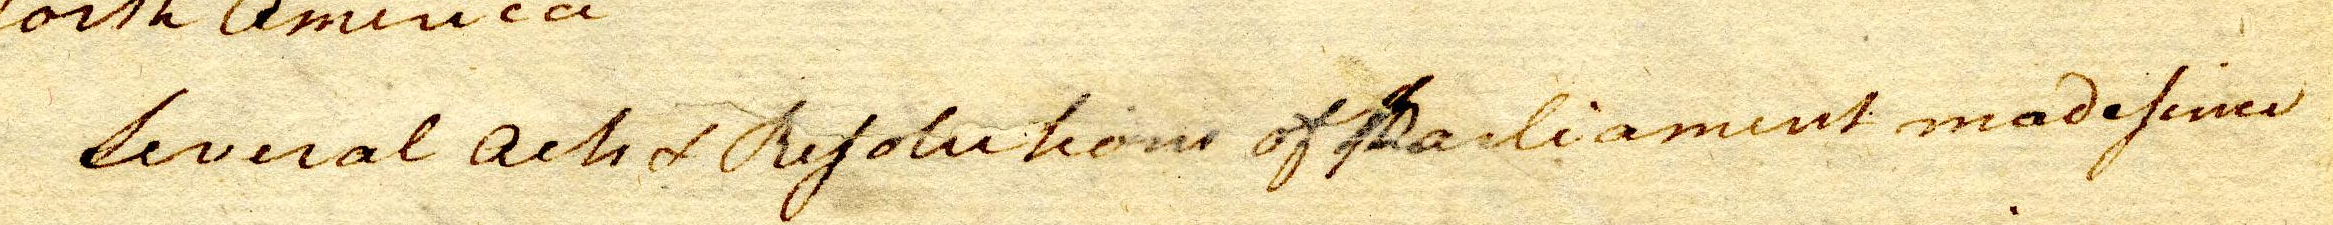Several acts & Resolutions of Parliament made since
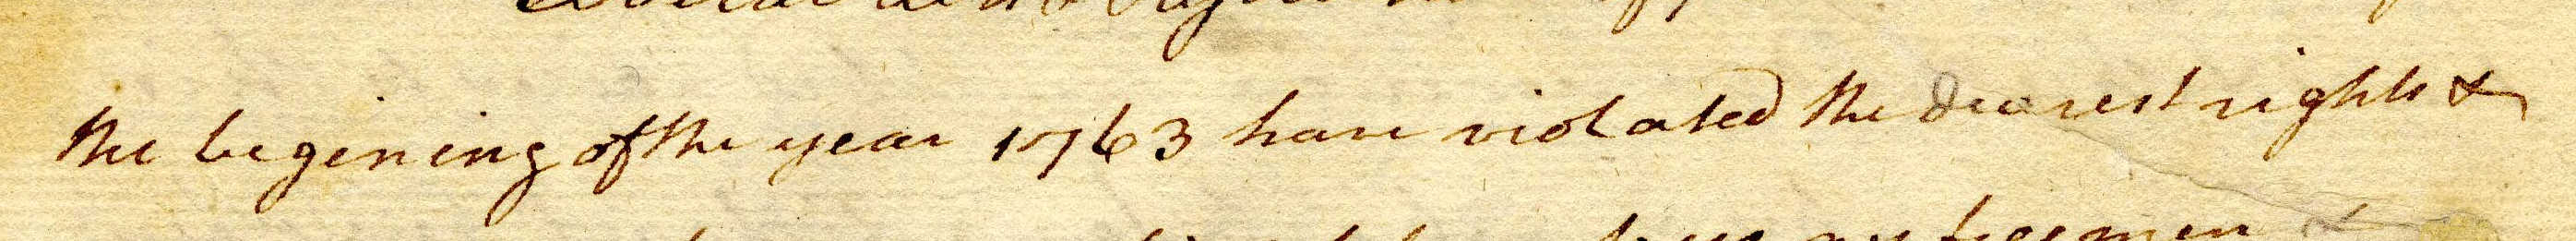the begining of the year 1763 have violated the dearest rights &
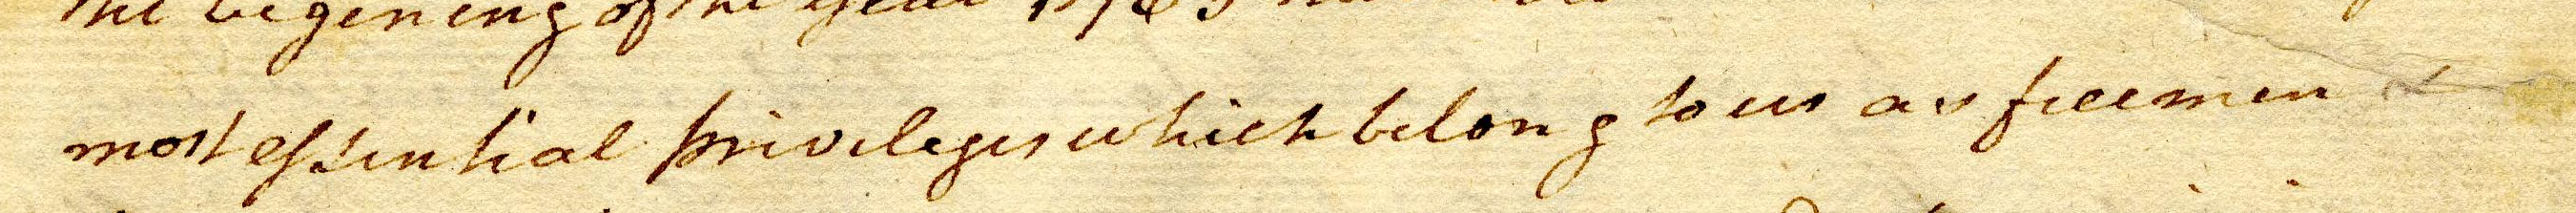most essential privileges which belong to us as freemen &
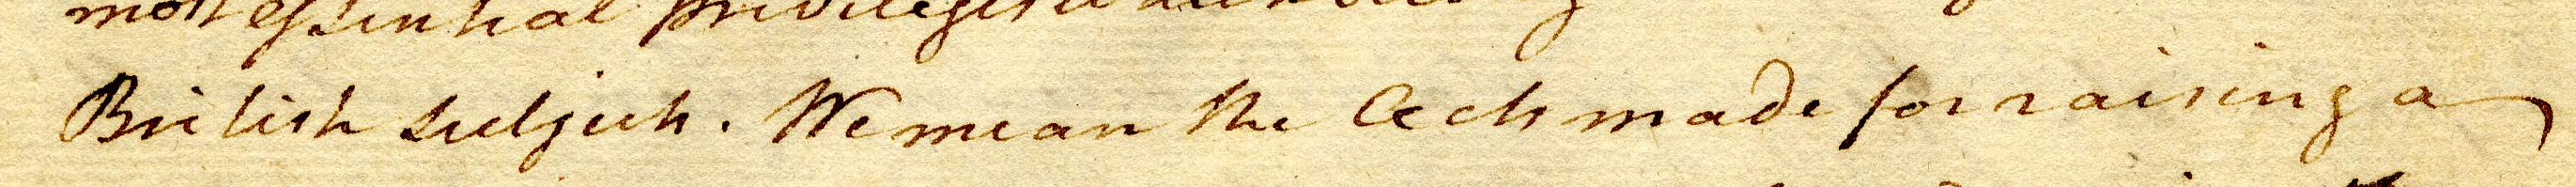British subjects. We mean the Acts made for raising a
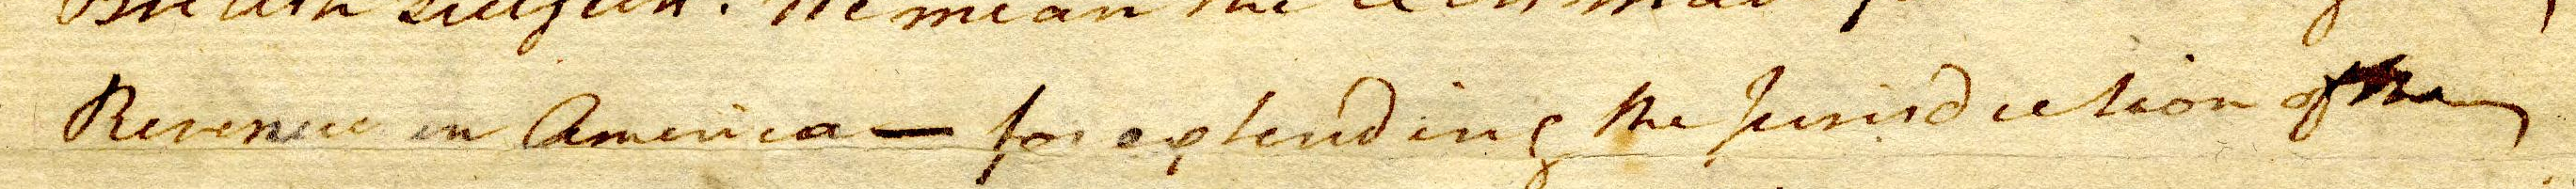Revenue in America- for extending the Jurisdiction of the
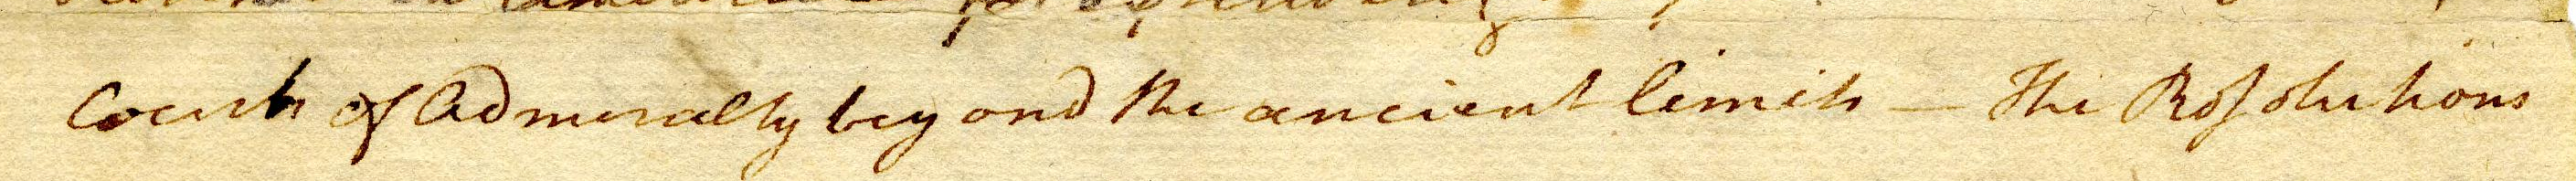Courts of Admiralty beyond the ancient limits- The Resolutions
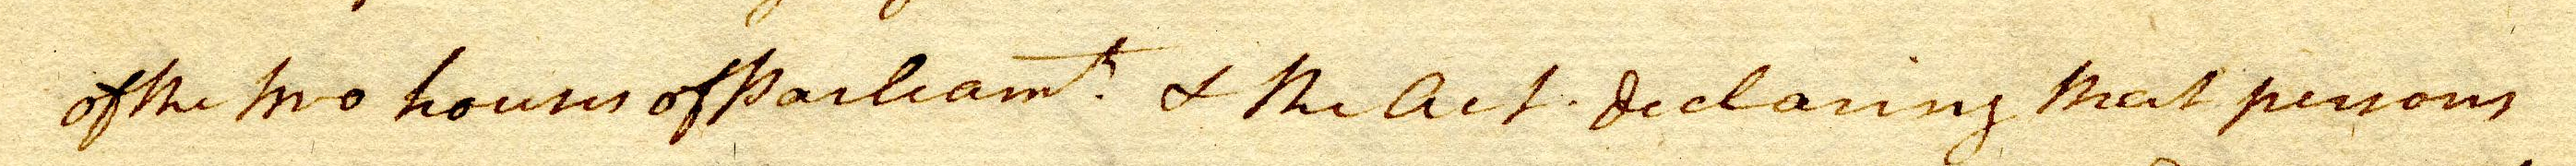of the mo houses of Parliam^t. & the Act declaring that persons
